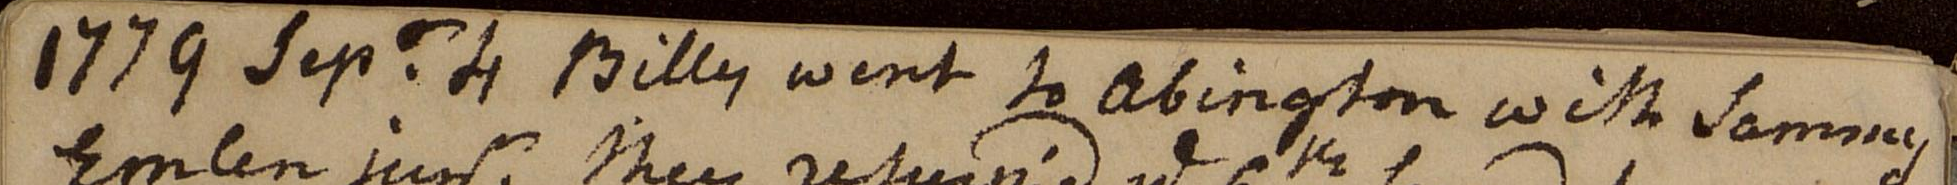1779 Sep^r. 4 Billy went to Abington with Sammy
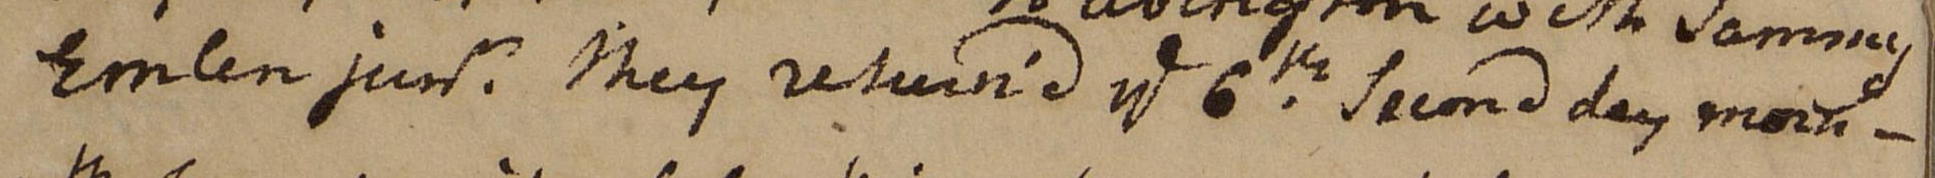Emlen jun^r. they return'd y^e 6^th. Second day morn^g-
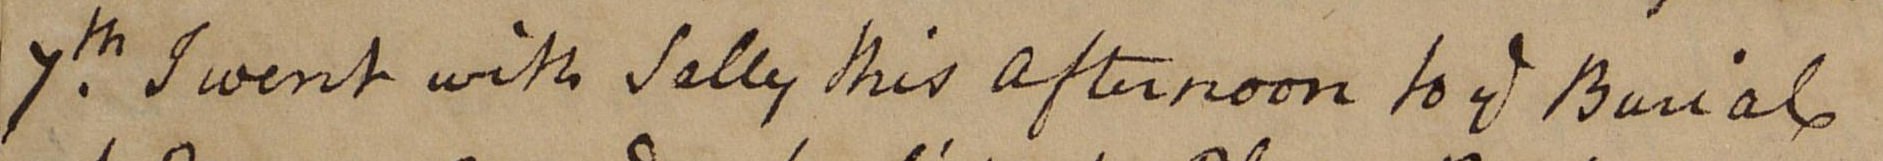7^th. I went with Sally this afternoon to y^e Burial
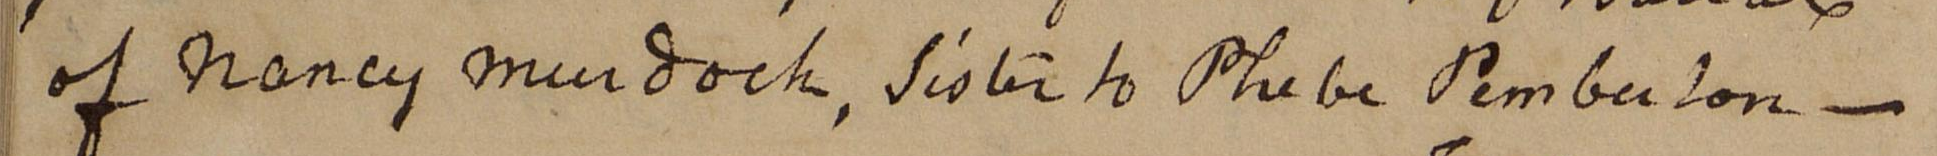of Nancy Murdock, Sister to Phebe Pemberton-
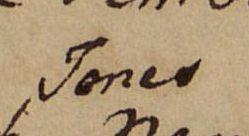Jones
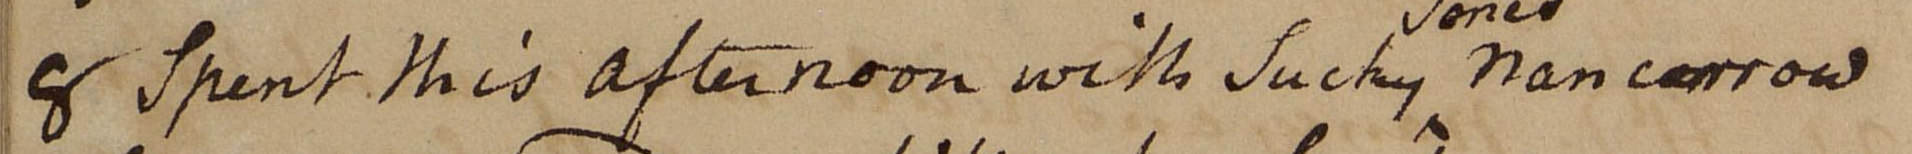8 spent this afternoon with Sucky ^ Nancarrrow
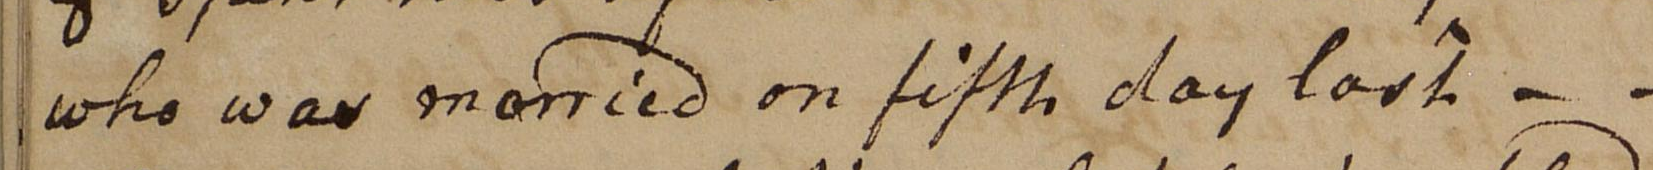who was married on fifth day last-
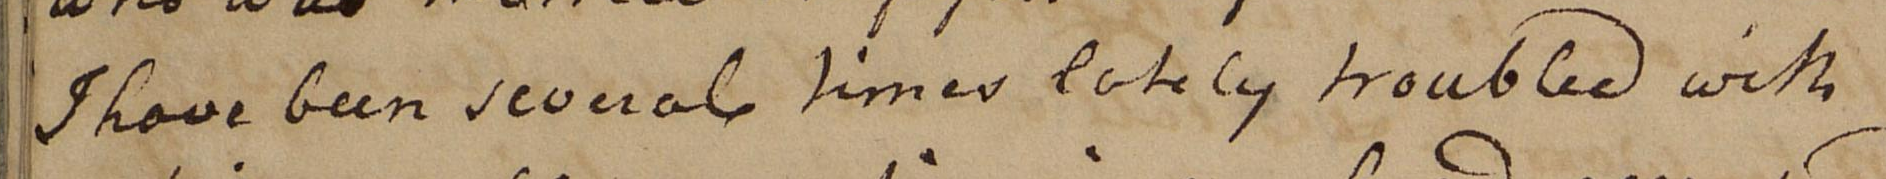I have been several times lately troubled with
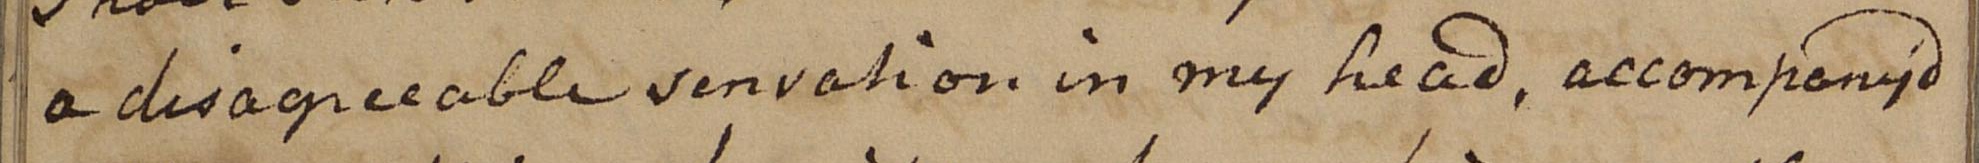a disagreeable sensation in my head, accompany'd
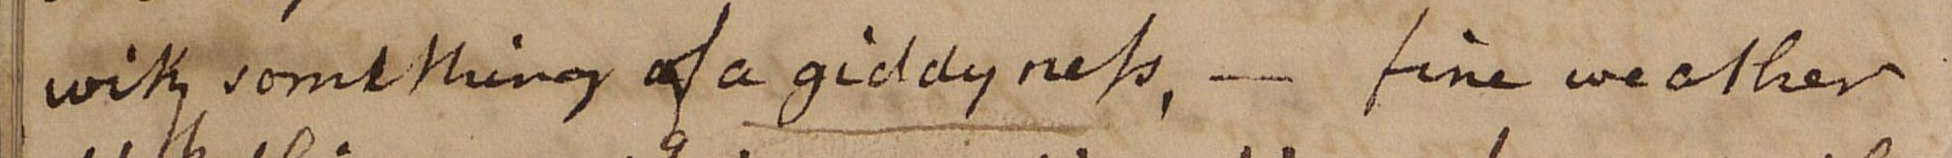with something of a giddyness,- fine weather
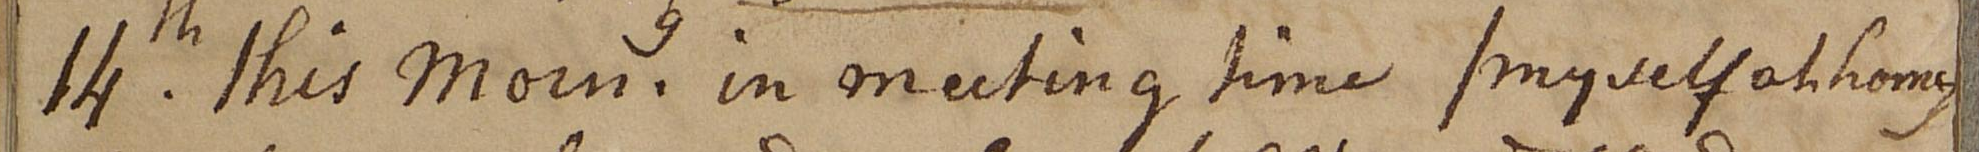14^th. this Morn^g. in meeting time (myself at homes
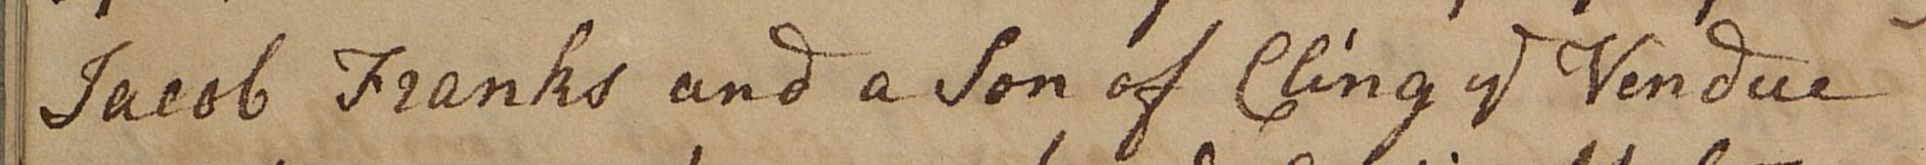Jacob Franks and a Son of Cling y^e Vendue
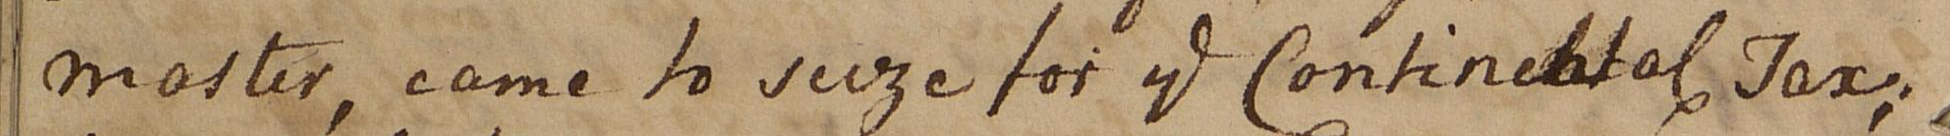master, came to seize for y^e Continental Tax;
